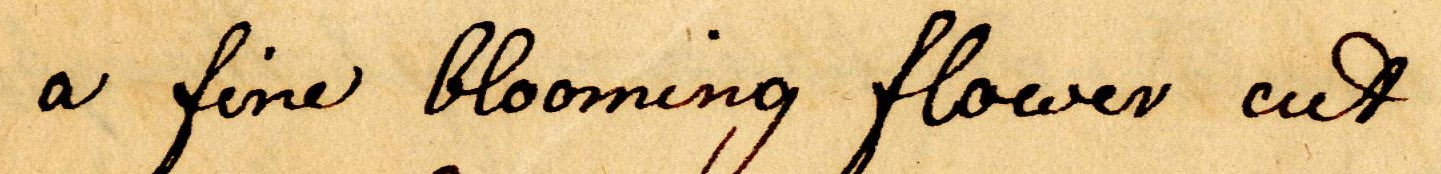a fine blooming flower cut
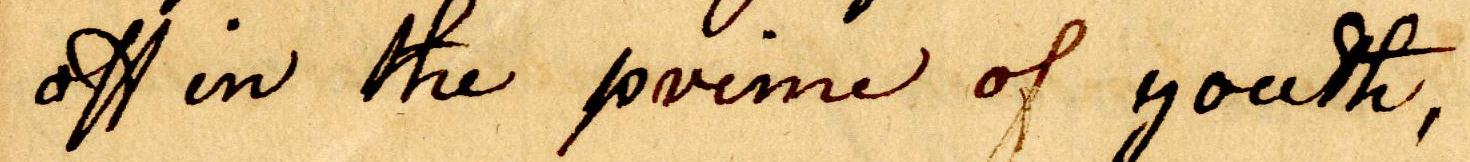off in the prime of youth,
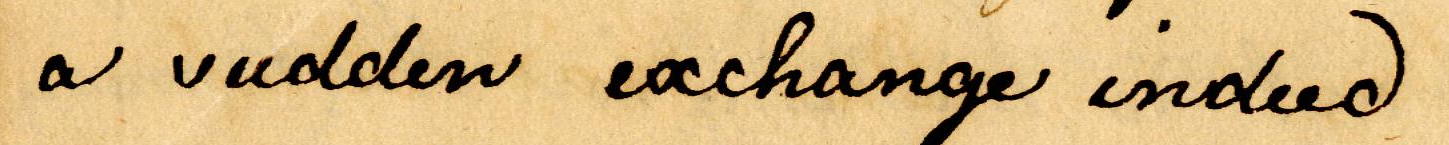a sudden exchange indeed
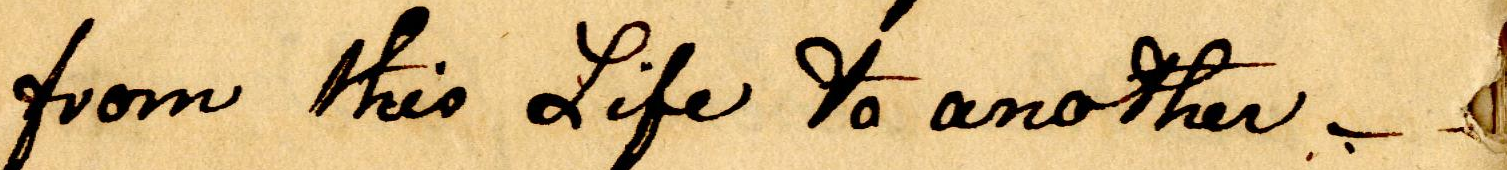from this Life to another-
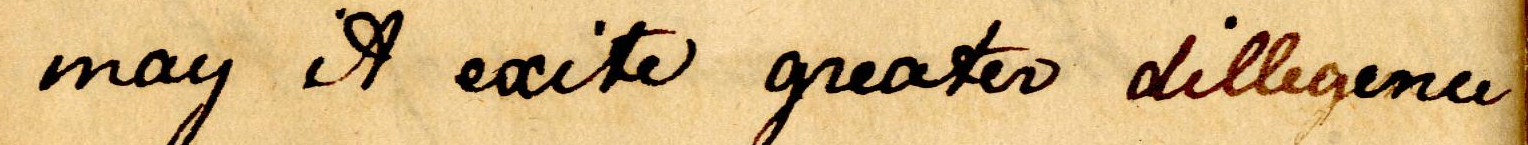may it exite greater dilligence
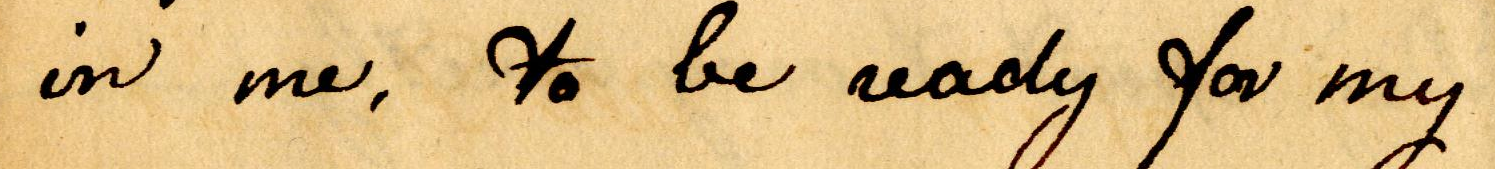in me, to be ready for my
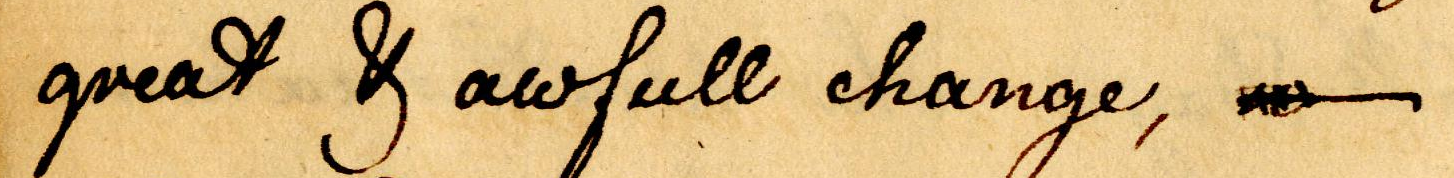great & awfull change,-
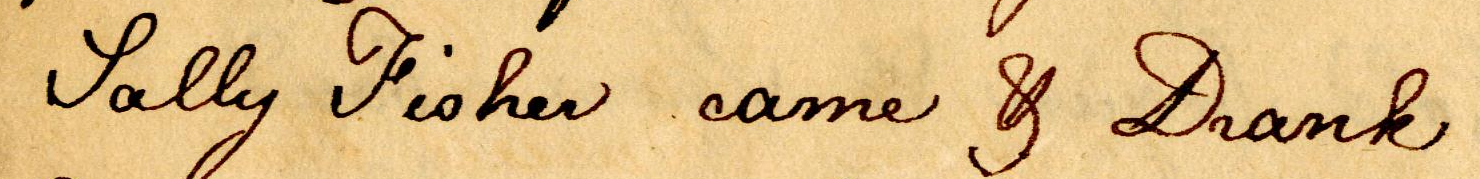Sally Fisher came & Drank
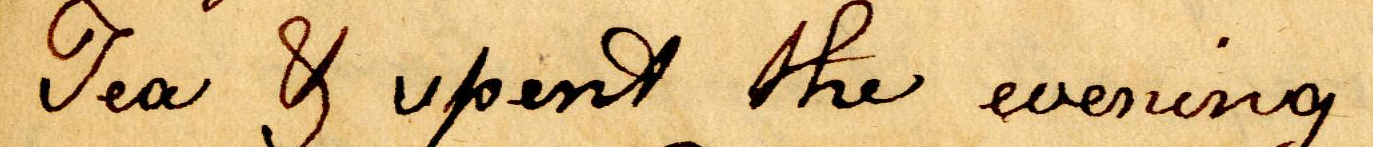Tea & spent the evening
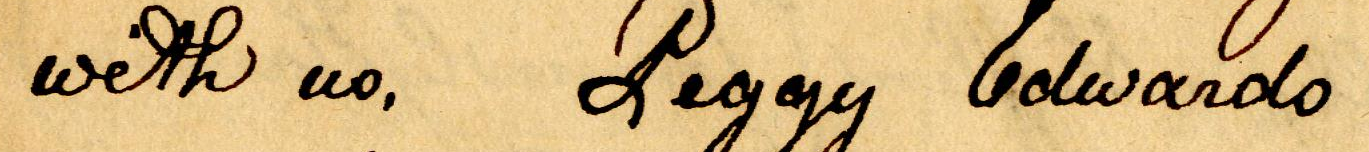with us, Peggy Edwards
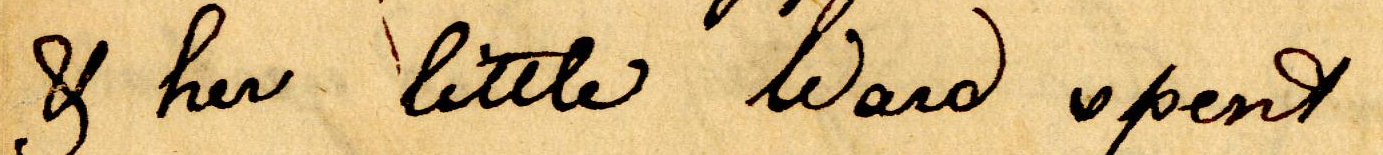& her little Ward spent
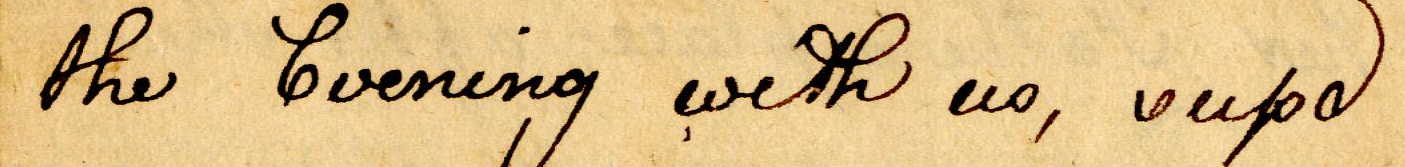the Evening with us, supd
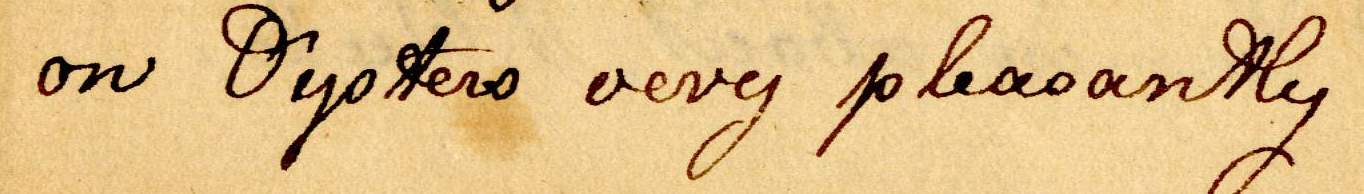on Oysters very pleasantly
